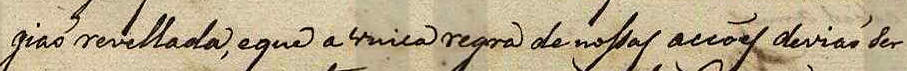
giaõ revellada, e que a vnica regra de nossas acções deviaõ ser
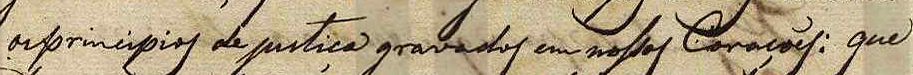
os principios de justiça gravados em nossos Coraçoẽs: que
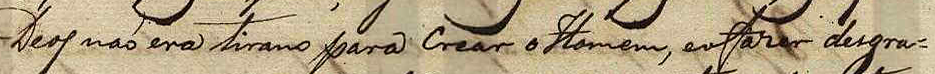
Deos naõ era tirano para crear o Homem, e o fazer desgra
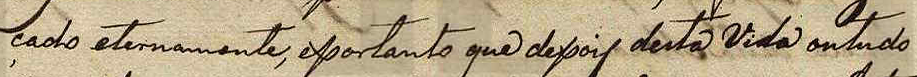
çado eternamente, e portanto que depois desta Vida ou tudo
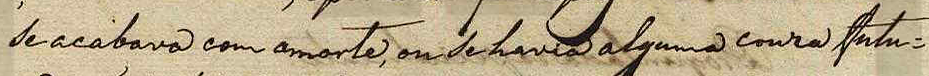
se acabava com a morte, ou se havia alguma couza futu
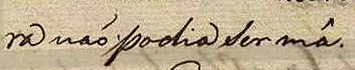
ra naõ podia ser má.
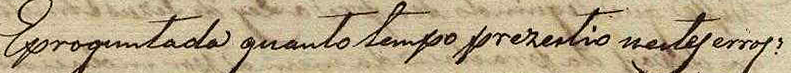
E proguntada quanto tempo prezestio nestes erros?
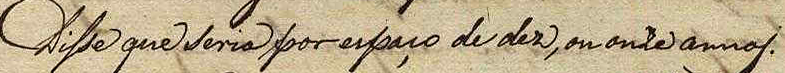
Disse que seria por espaço de dez, ou onze annos.
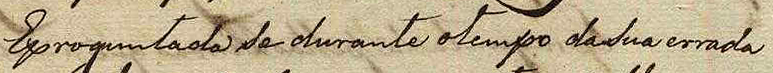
E proguntado se durante o tempo da sua errada
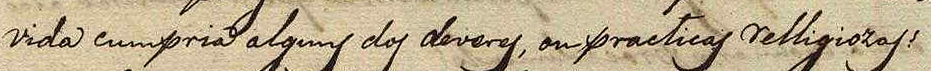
vida cumpria alguns dos deveres, ou practicas relligiozas?
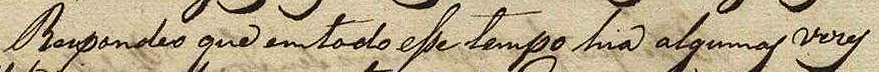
Respondeo que em todo esse tempo hia algumas vezes
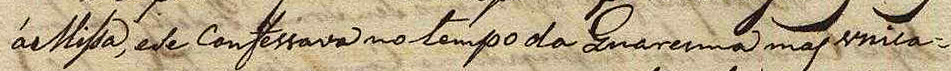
á Missa, e se confessava no tempo da Quaresma mas vnica
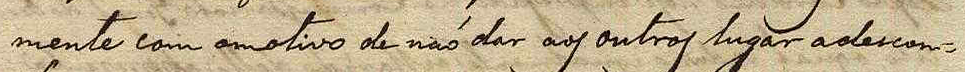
mente com o motivo de naõ dar aos outros lugar a descon
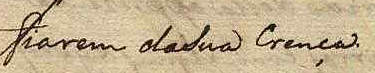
fiarem da sua crença.
